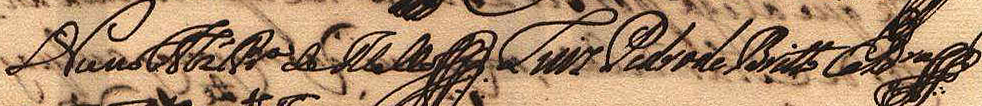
Nuno Alz̄ Pr.a de Mello Luiz Pedro de Britto Caldra
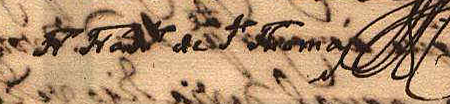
Fr Fran.co de s̄.o Thomas
